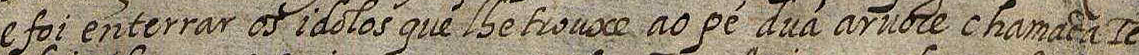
e foi enterrar os idolos que lhe trouxe ao pé duā aruore chamada Te
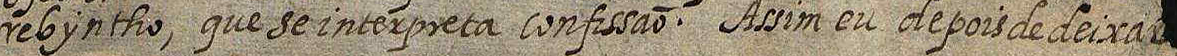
rebyntho, que se interpreta confissão. Assim eu depois de deixar
